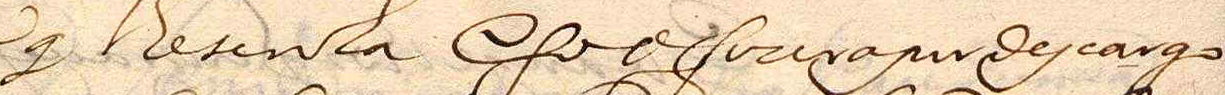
q̄ lhe tenha E so o fizera por descargo
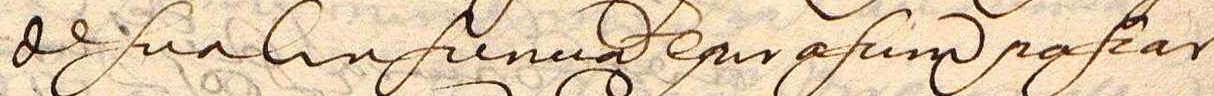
de sua Consiencia e por assim passar
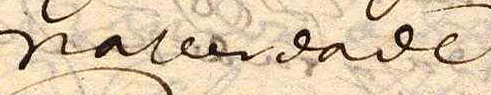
na verdade
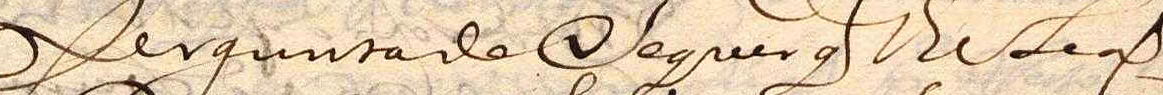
Perguntado Se quer q̄ lhe Leaõ
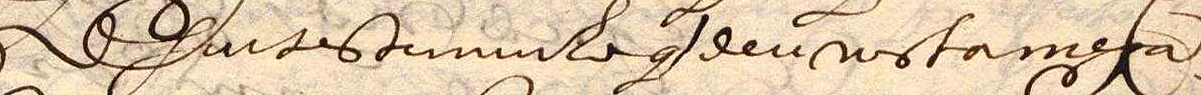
seu testemunho q̄ deu nesta meza
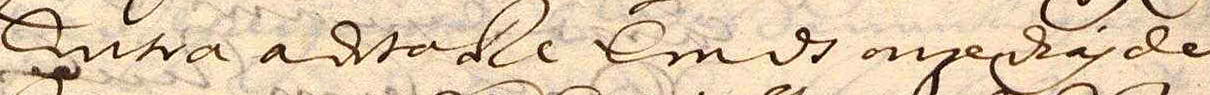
contra a dita Re em os onze dias de
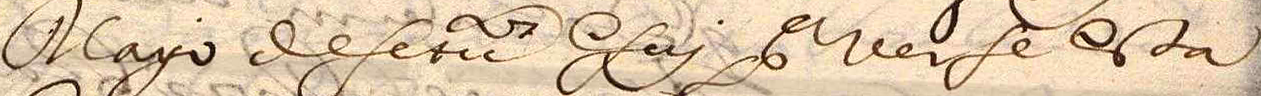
Mayo de setce.tos e seis p.a ver se esta
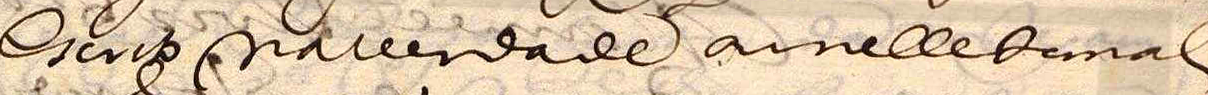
Escrito na verdade ou nelle tem al
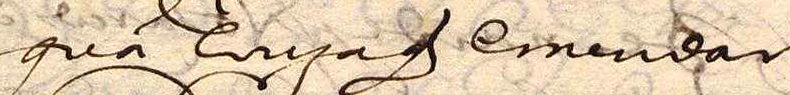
guā couza q̄ emendar
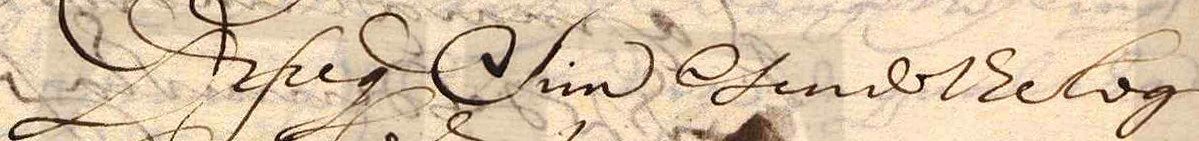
Disse q̄ Sim, e sendo lhe logo
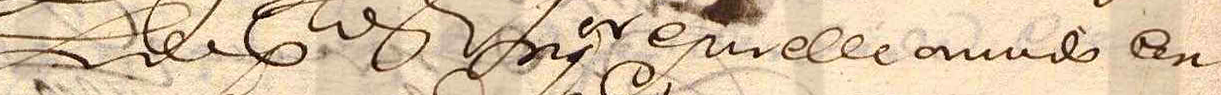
Lido p.lo sr. Inq.or e por elle ouuido e en
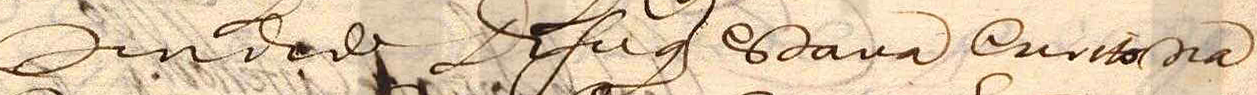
tendido Disse q̄ estava escrito na
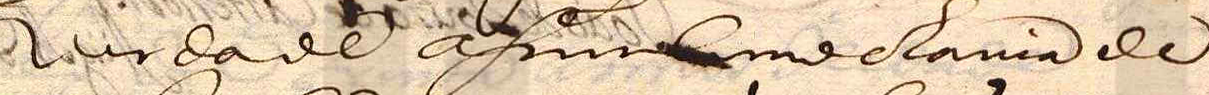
verdade asim como hauia de
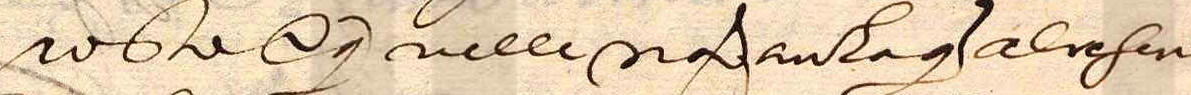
posto e q̄ nelle naõ tinha q̄ acresen
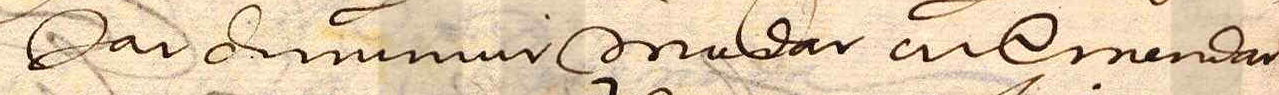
tar deminuir mudar ou emendar
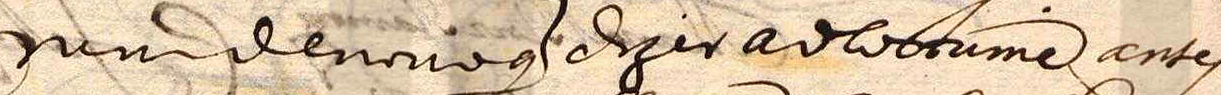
nem de nouo q̄ dizer ao costume antes
